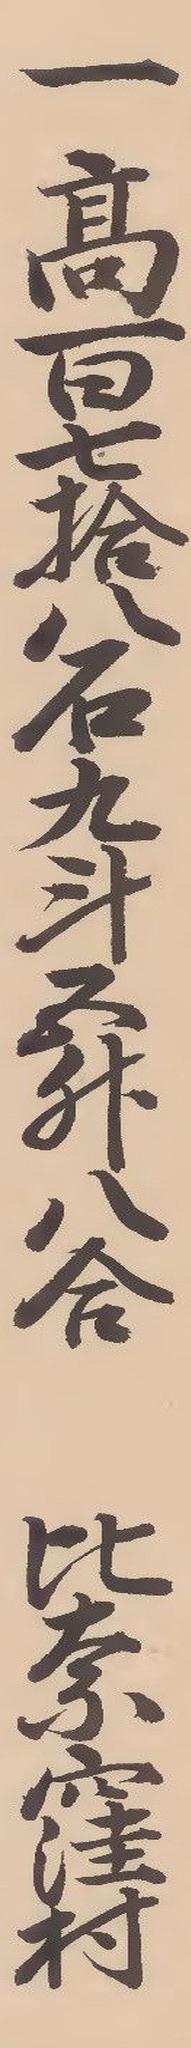一高百七拾八石九斗五升八合比奈窪村
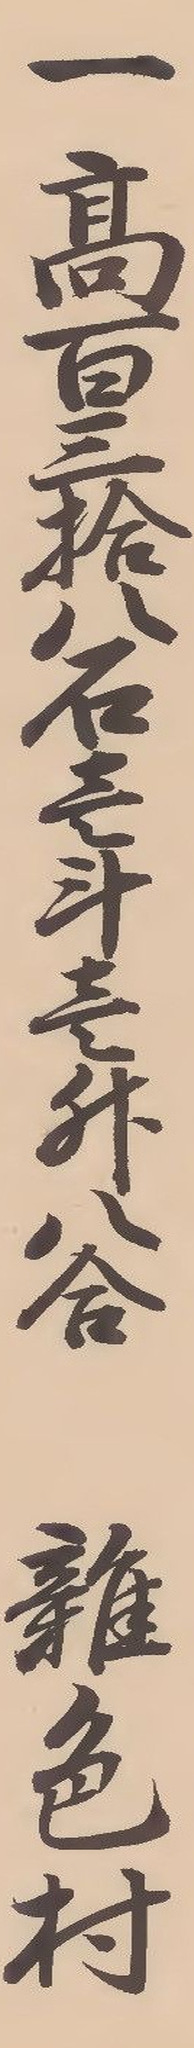一高百三拾八石壱斗壱升八合雑色村
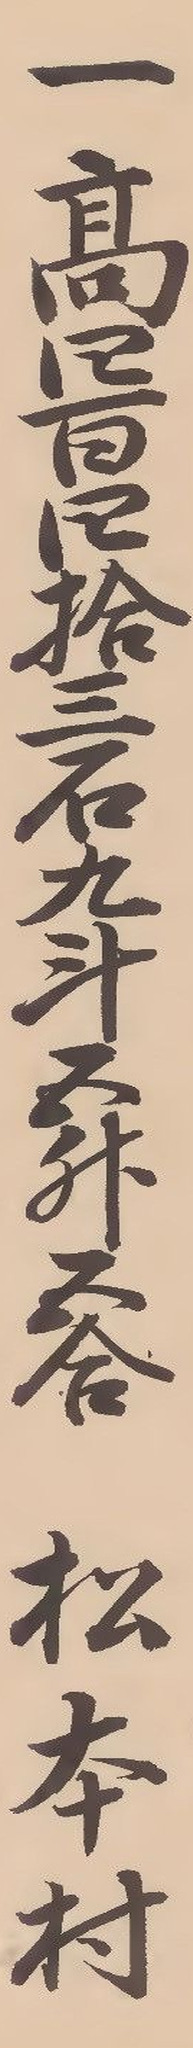一高四百四拾三石九斗五升五合松本村
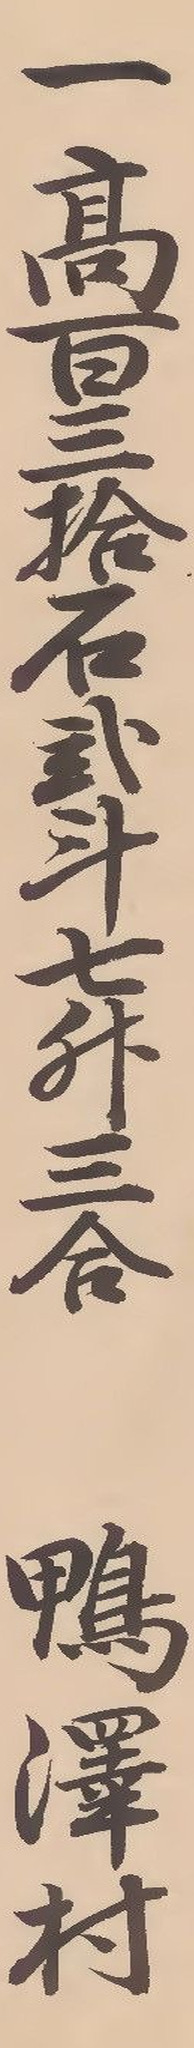一高百三拾石弐斗七升三合鴨澤村
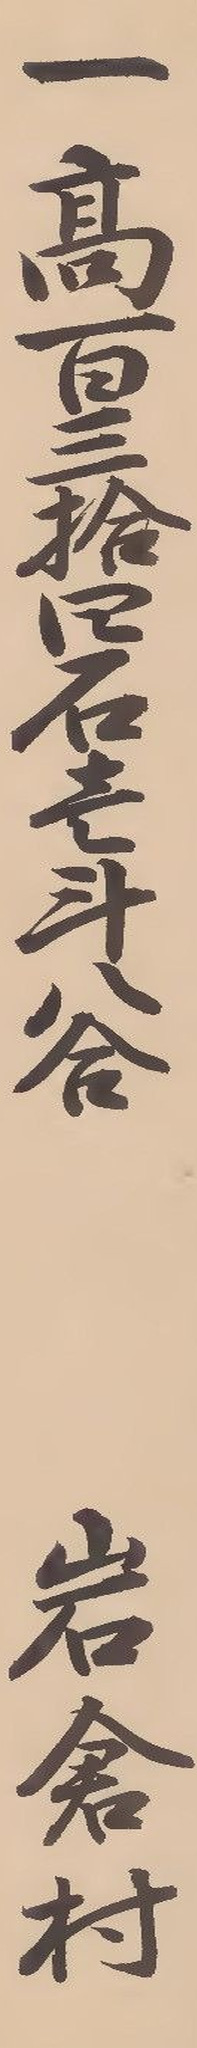一高百三拾四石壱斗八合岩倉村
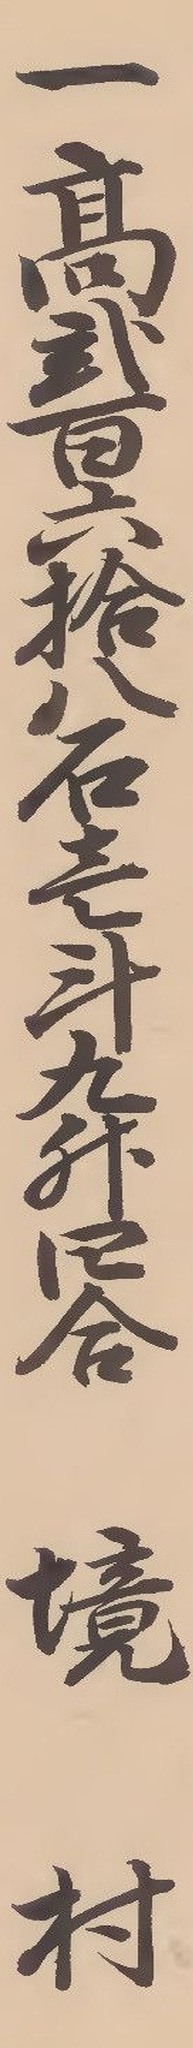一高弐百六拾八石壱斗九升四合境村
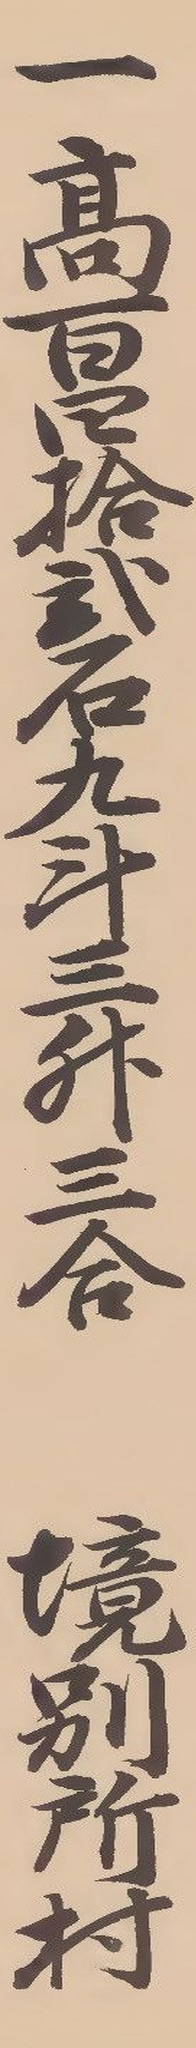一高百四拾弐石九斗三升三合境別所村
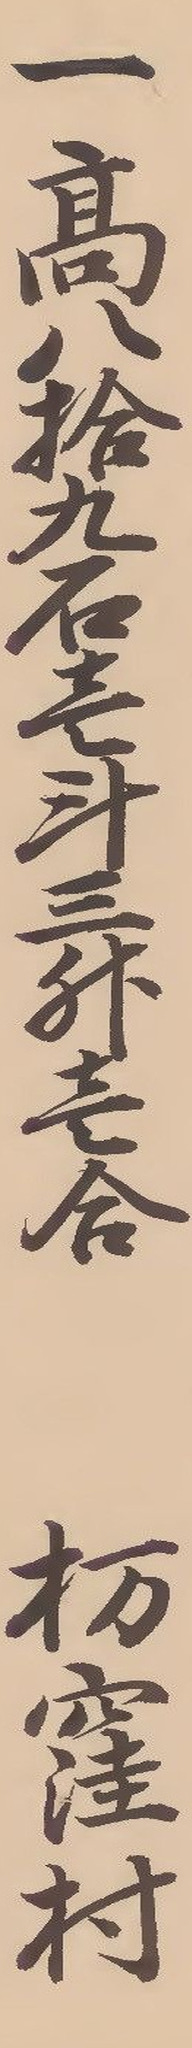一高八拾九石壱斗三升壱合栃窪村

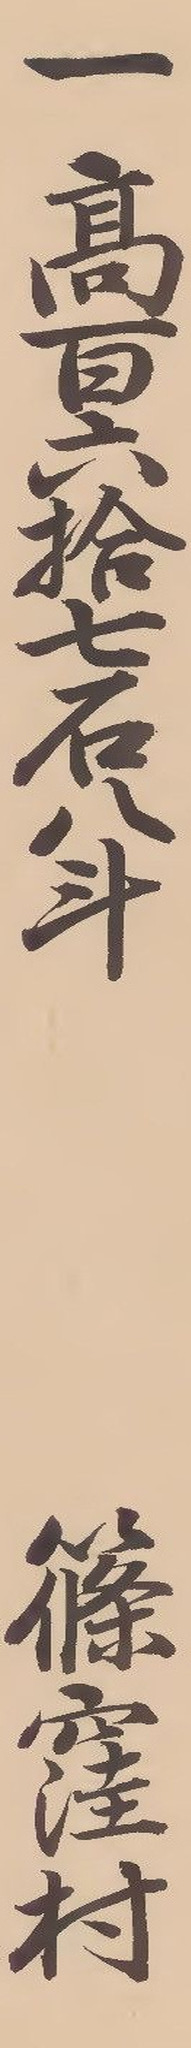一高百六拾七石八斗篠窪村
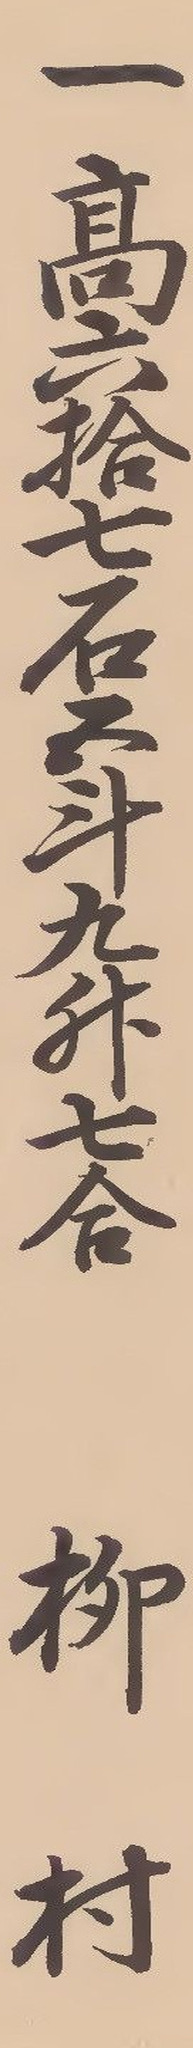一高六拾七石五斗九升七合柳村
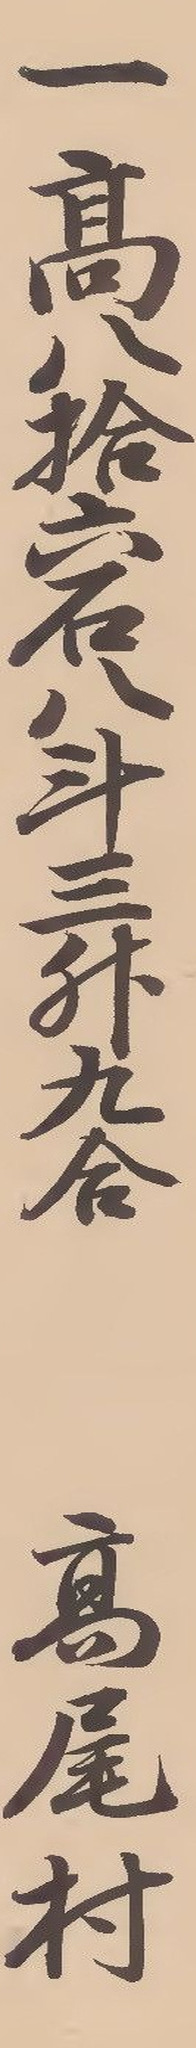一高八拾六石八斗三升九合高尾村
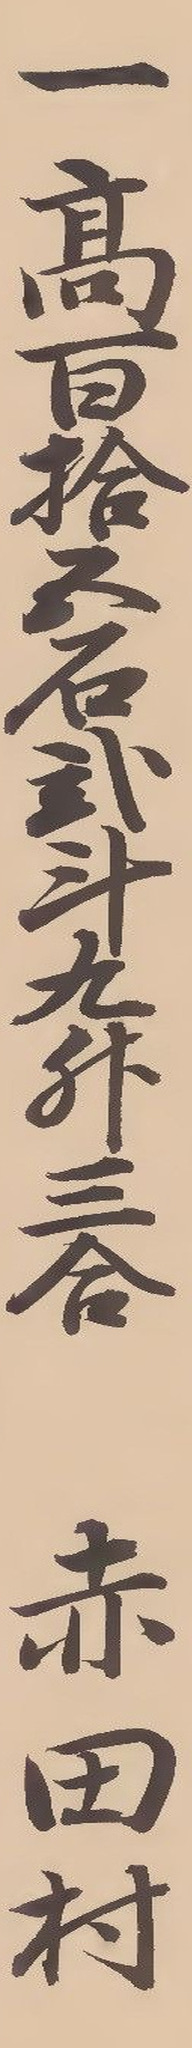一高百拾五石弐斗九升三合赤田村
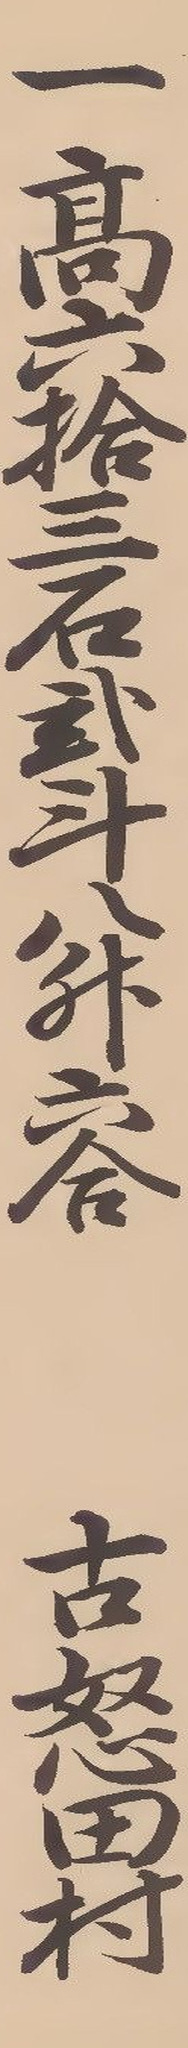一高六拾三石弐斗八升六合古怒田村
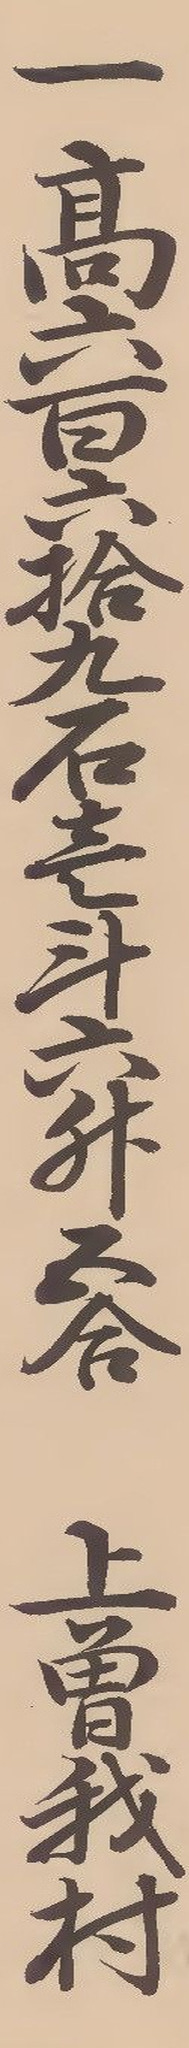一高六百六拾九石壱斗六升五合上曽我村
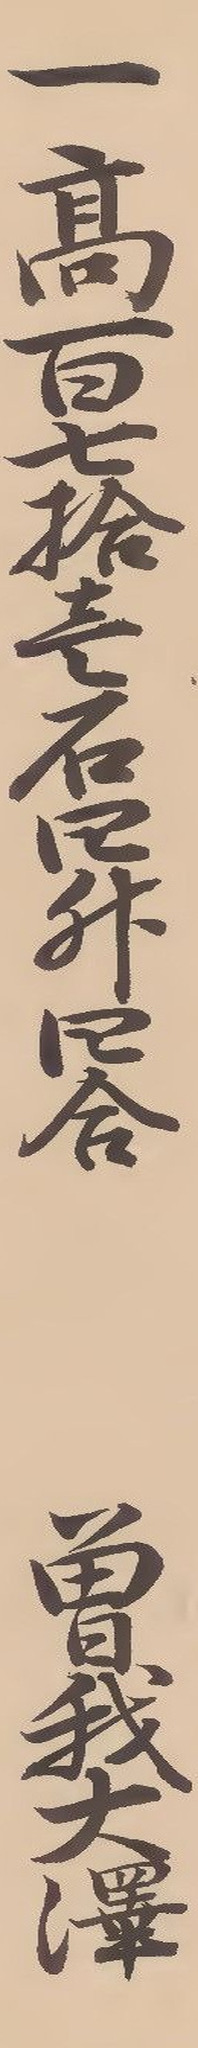一高百七拾壱石四升四合曽我大澤
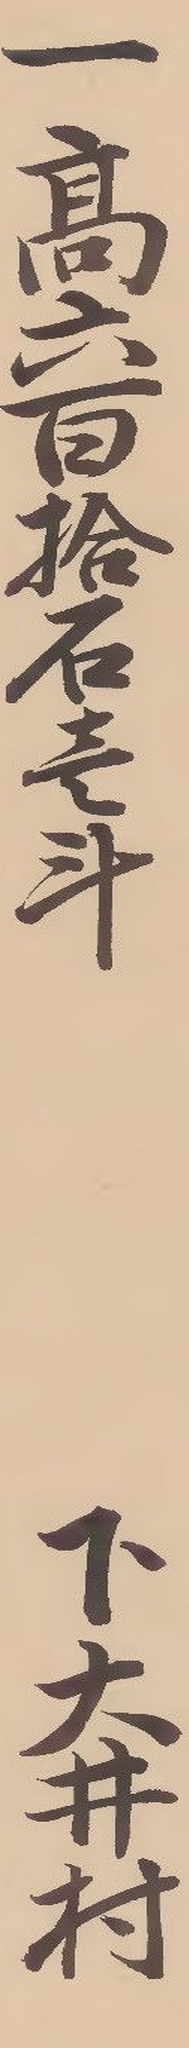一高六百拾石壱斗下大井村
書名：相模国郷帳
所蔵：国立公文書館 National Archives of Japan
